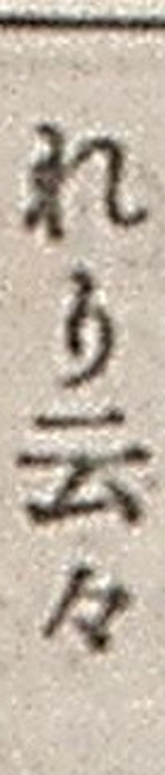れり云々
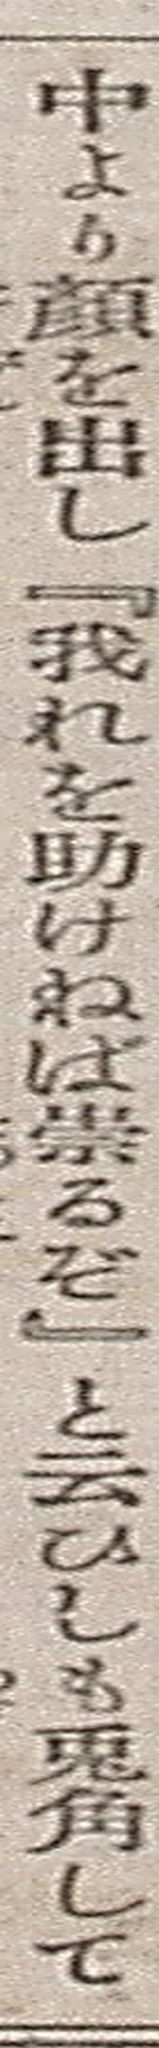中より顔を出し『我れを助けねば祟るぞ』と云ひしも兎角して
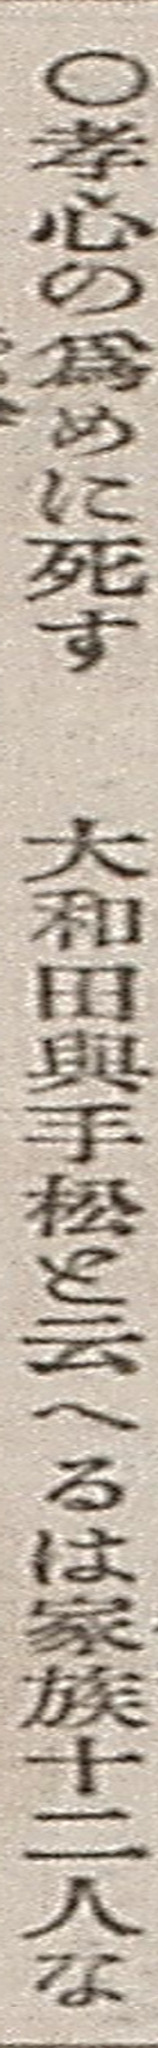○孝心の為めに死す大和田與手松と云へるは家族十二人な
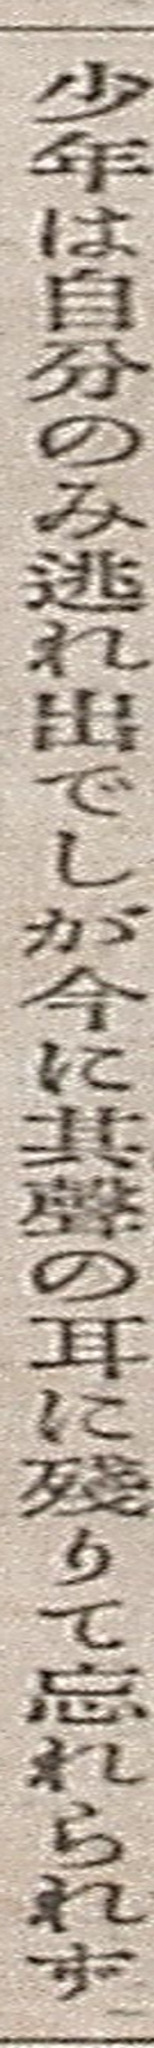少年は自分のみ逃げ出でしが今に其声の耳に残りて忘れられず
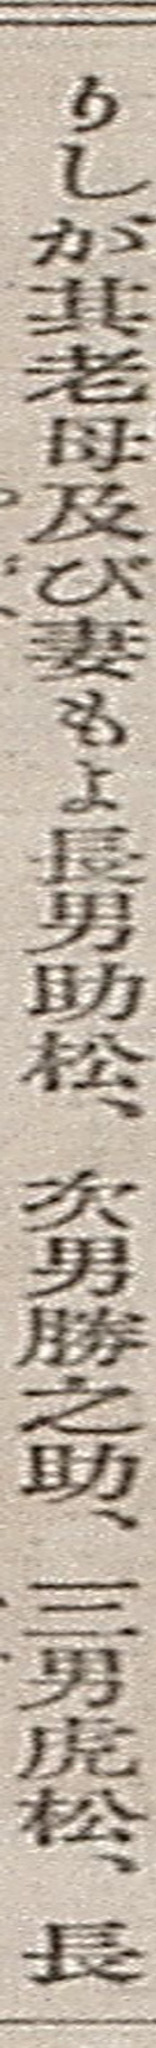りしが其老母及び妻もよ長男助松、次男勝之助、三男虎松、長
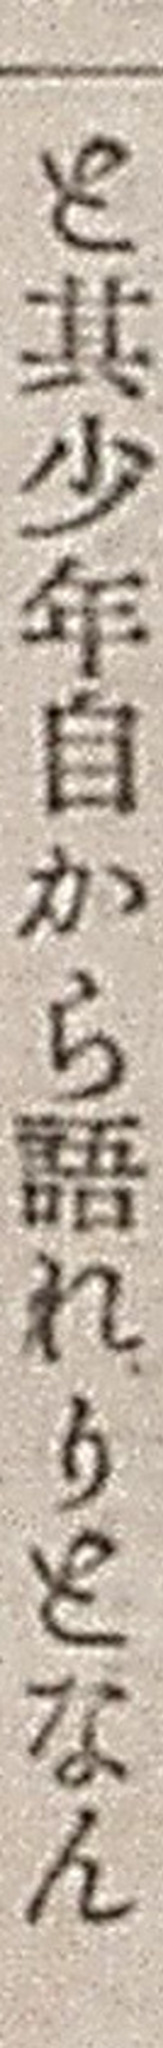と其少年自から語れりとなん
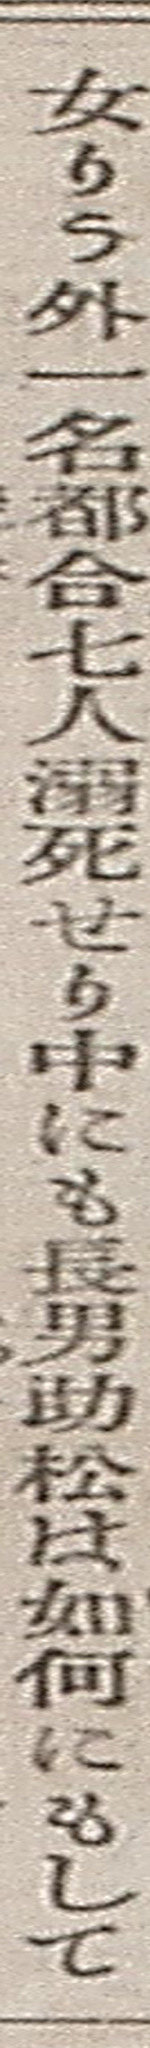女りう外一名都合七人溺死せり中にも長男助松は如何にもして
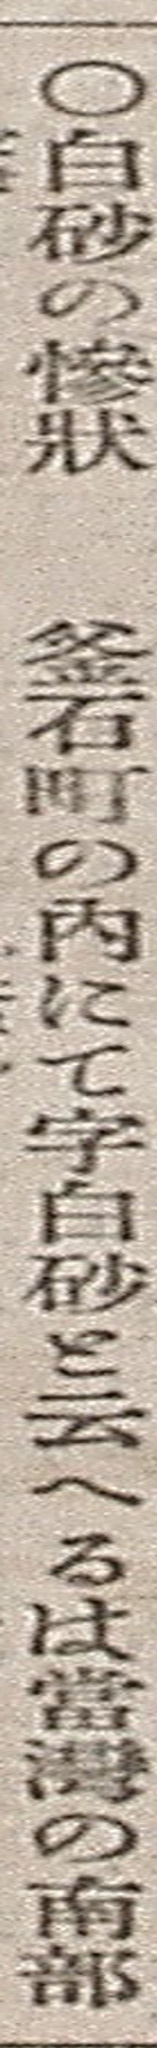○白砂の惨状釜石町の内にて字白砂と云へるは当湾の南部
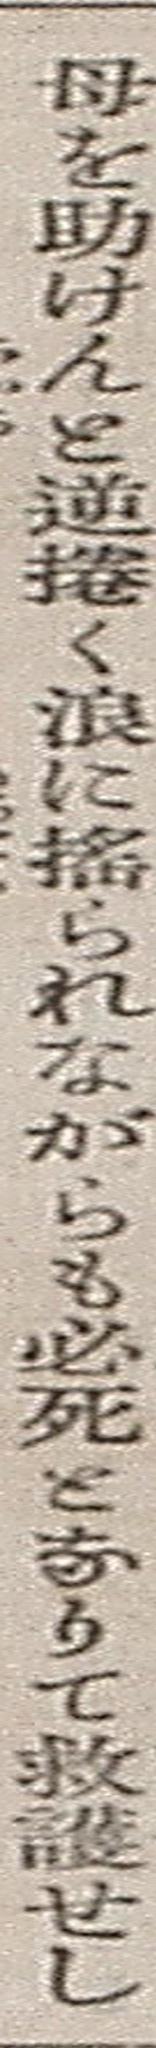母を助けんと逆捲く浪に揺られながらも必死となりて救護せし
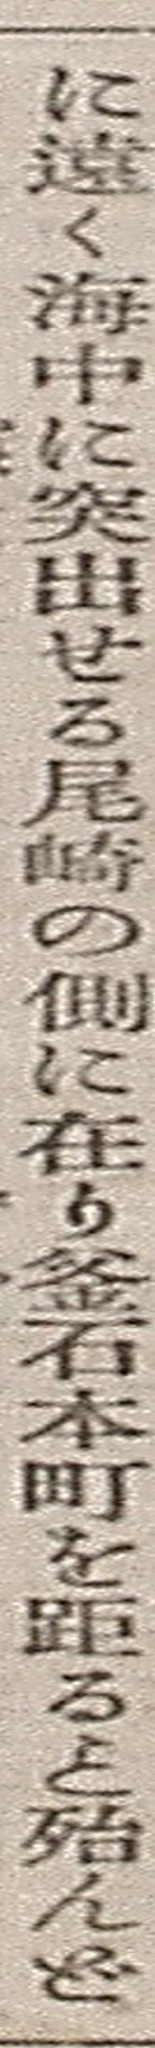に遠く海中に突出せる尾崎の側に在り釜石本町を距ること殆んど
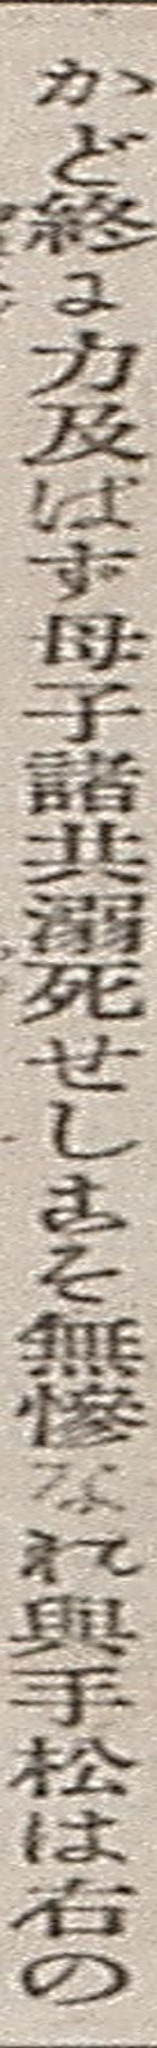かど終に力及ばず母子諸共溺死せしこそ無惨なれ與手松は右の
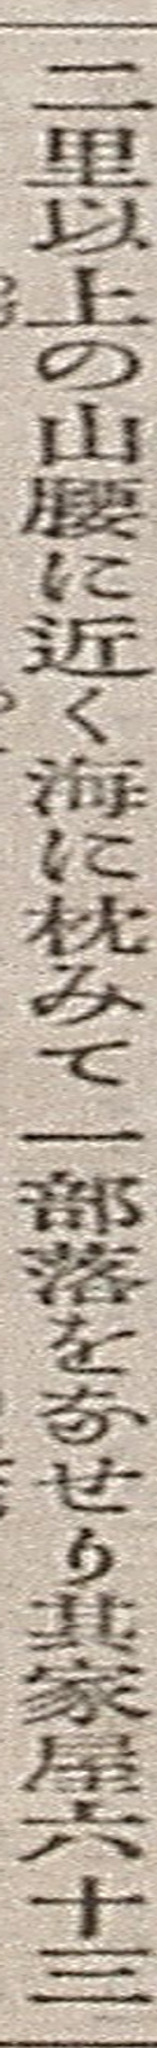二里以上の山腰に近く海に枕みて一部落をなせり其家屋六十三
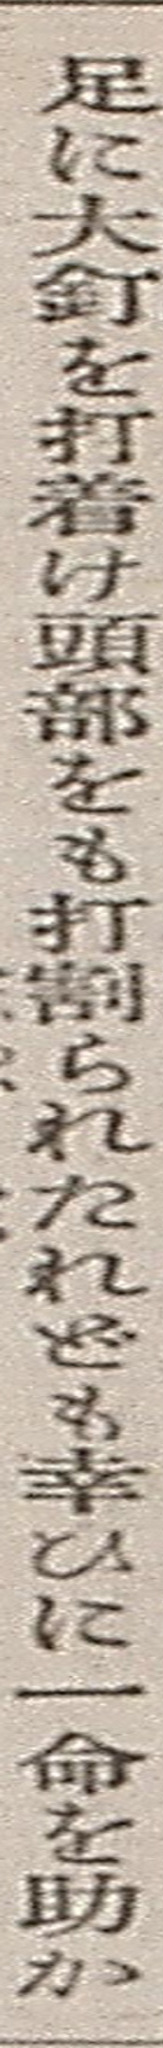足に大釘を打着け頭部をも打割られたれども幸ひに一命を助か
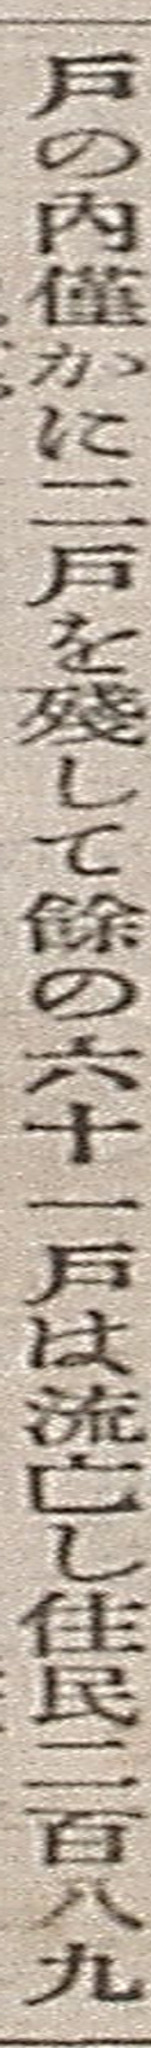戸の内僅かに二戸を残して余の六十一戸は流亡し住民二百八九
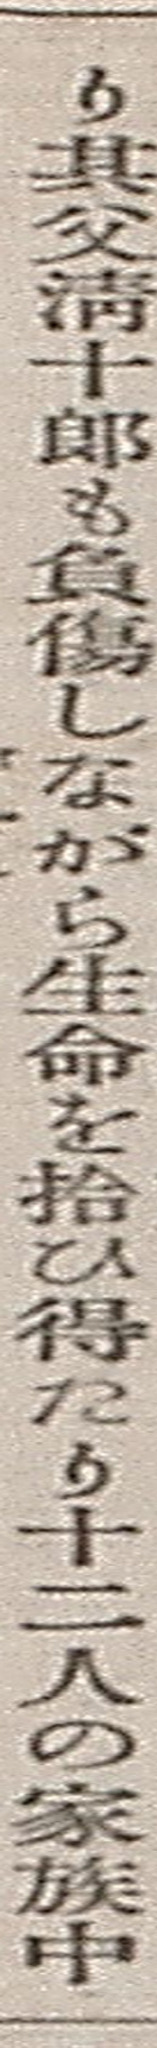り其父清十郎も負傷しながら生命を拾ひ得たり十二人の家族中
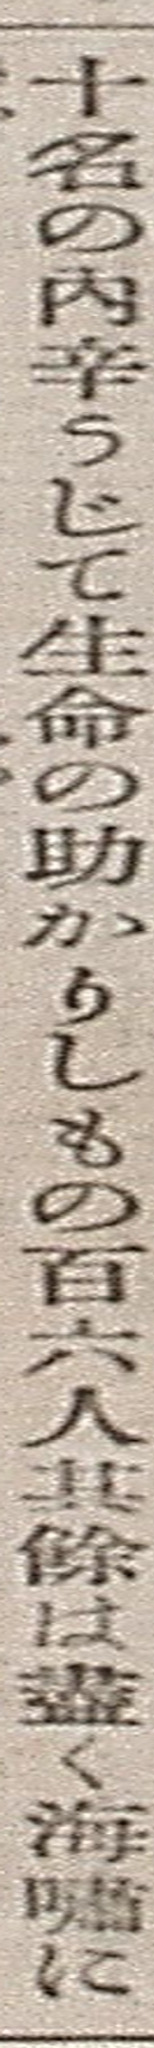十名の内辛うじて生命の助かりしもの百六人其余は尽く海嘯に
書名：風俗畫報臨時増刊第百十九號　大海嘯被害録（中）
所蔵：東京大学地震研究所図書室 Earthquake Research Institute Library, The University of Tokyo, JAPAN
